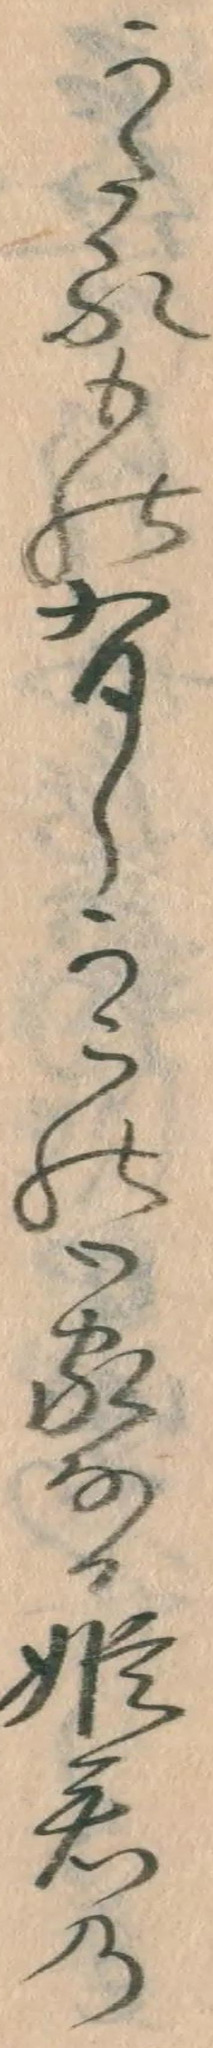かたるもの有しかこの御家なる姫君の
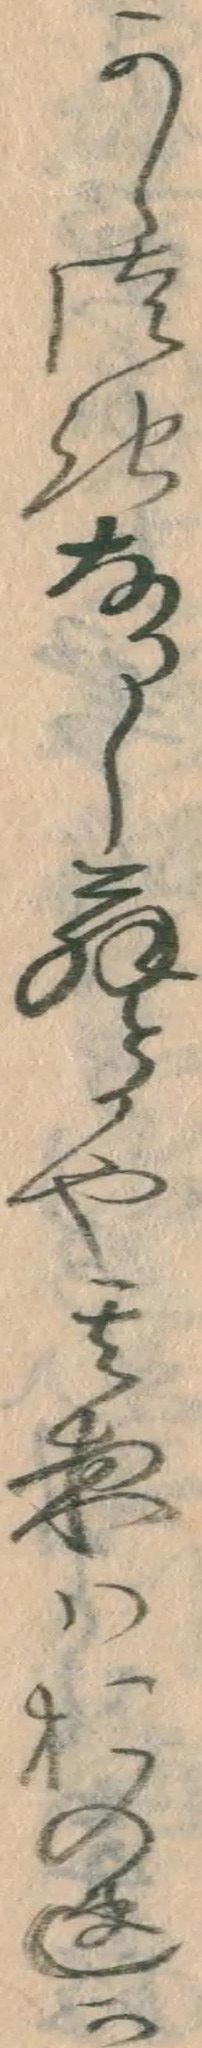かしつきなりし翁とかや其夜ハおのれか
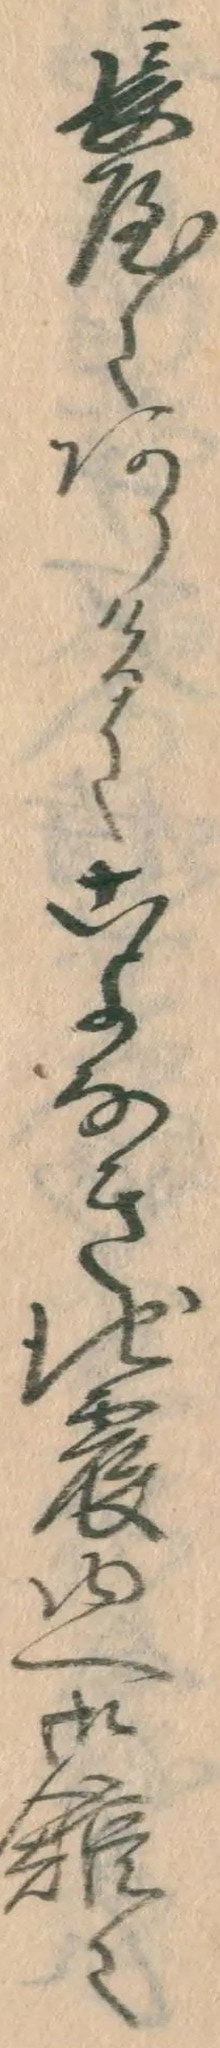長屋にありけるにこよなき地震ゆへ御館に
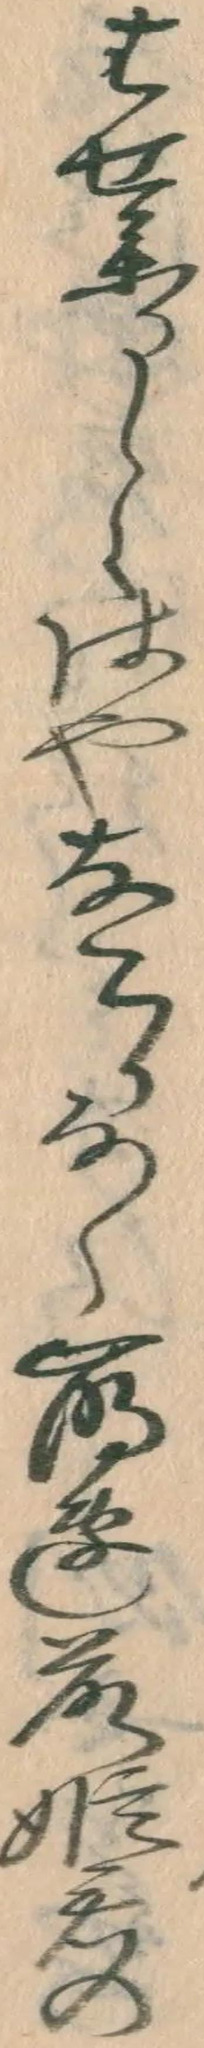はせ参りしにはやなこりなく崩れ落姫君の
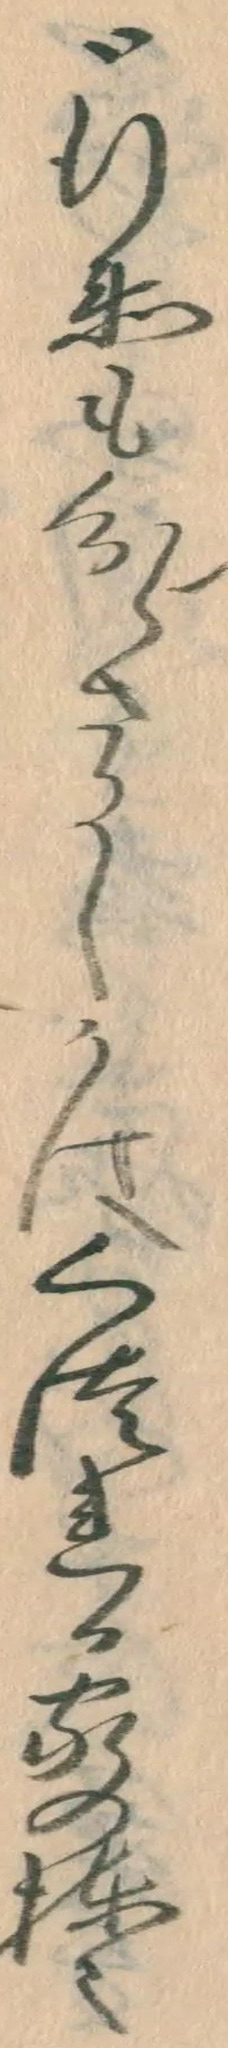御行ゑも分らさりしかはくつれる家の棟に
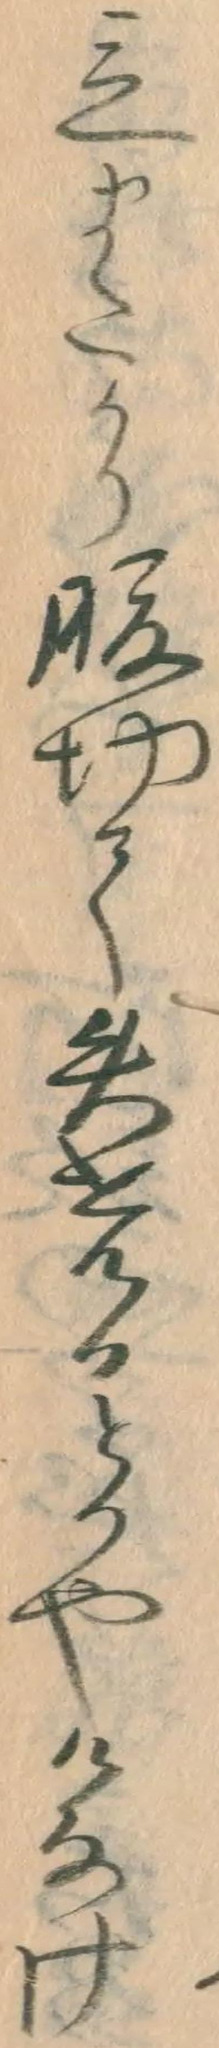立またかり腹切て失せけるとかやけなけ

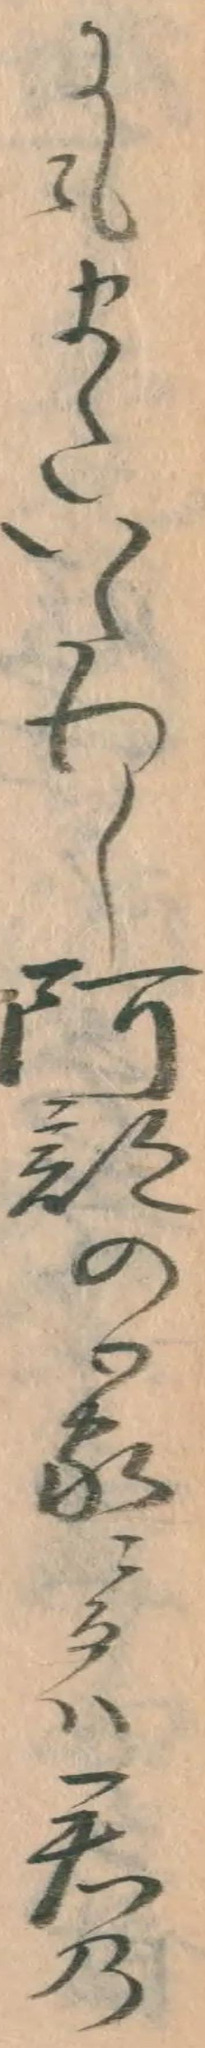にもまたいたわし阿部の御家ニ而ハ君の
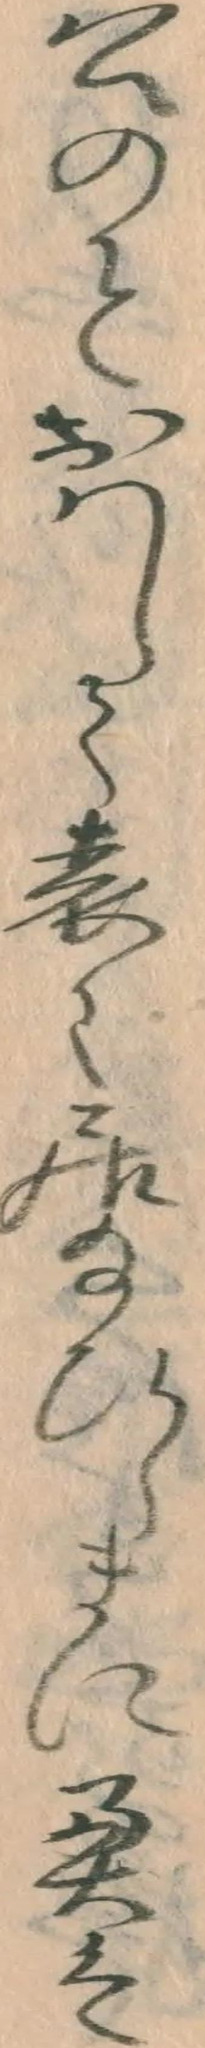公のことおハして表に居玉ひしまに奥は
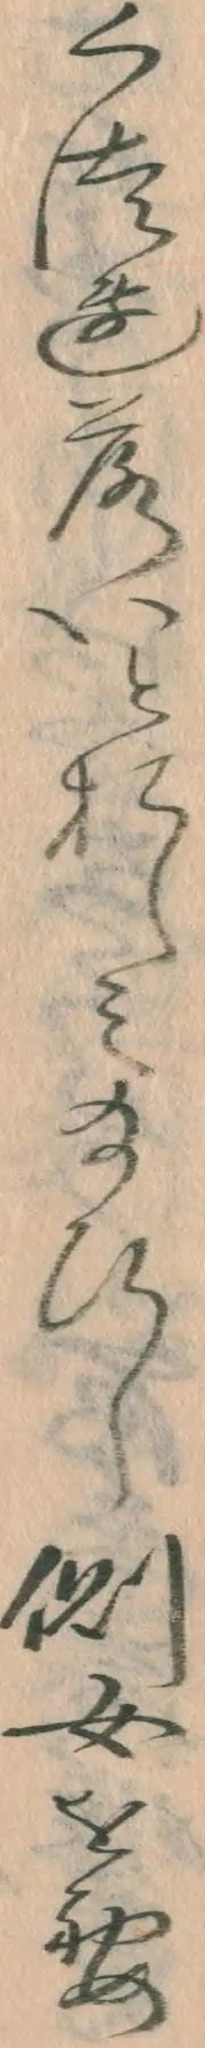くつれ落いとおしミ玉ひし側女を初め
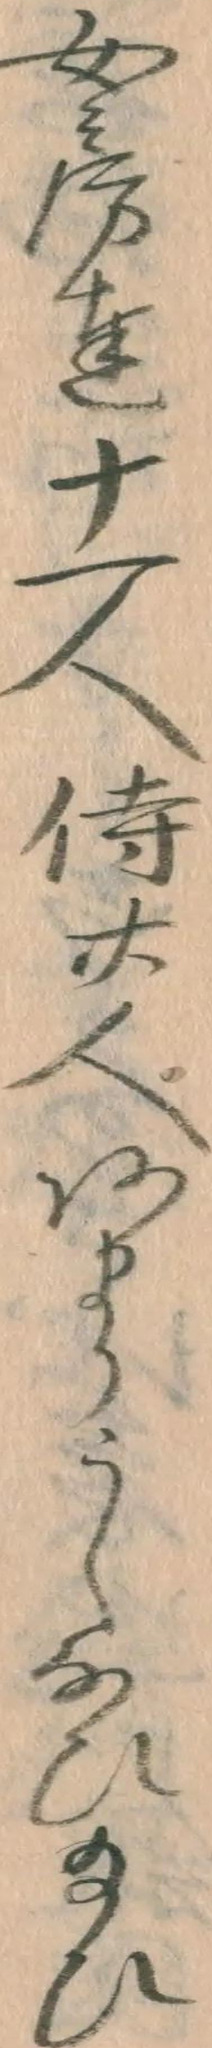女房達十一人侍廿人あまりうしなひ玉ひ
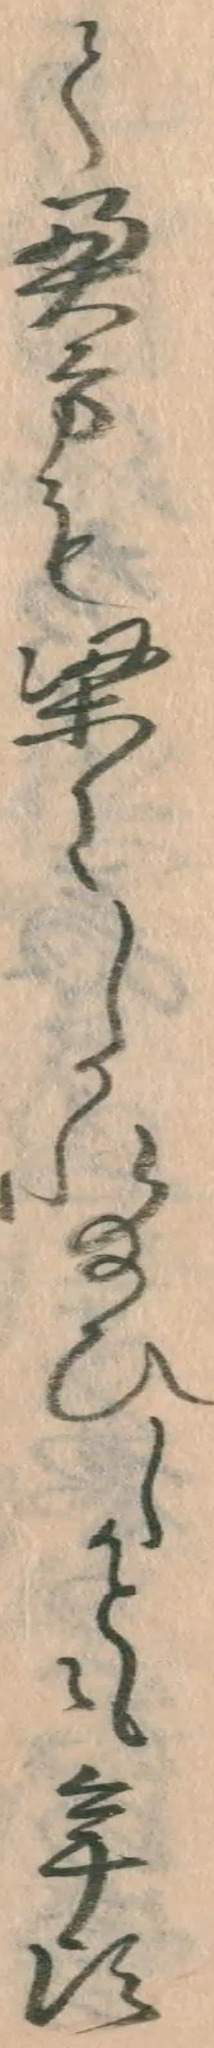て奥方も梁にしかれ玉ひしかとも年頃
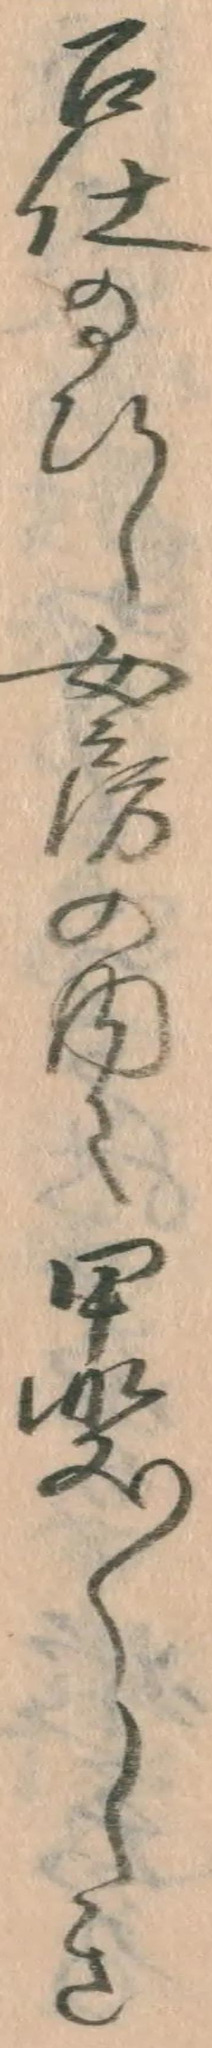召仕玉ひし女房の内に甲斐〳〵しき
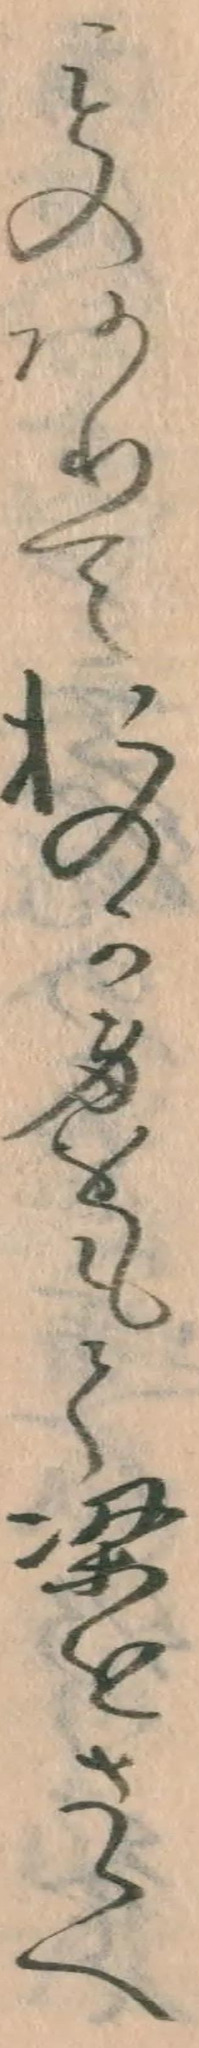ものありておのか身をもて梁をさゝへ
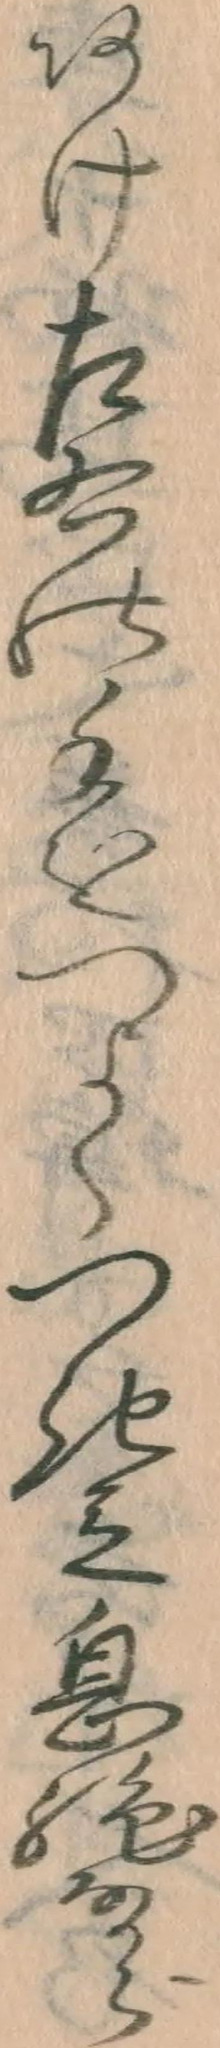あけ左右の手をつよくつき立息絶なから
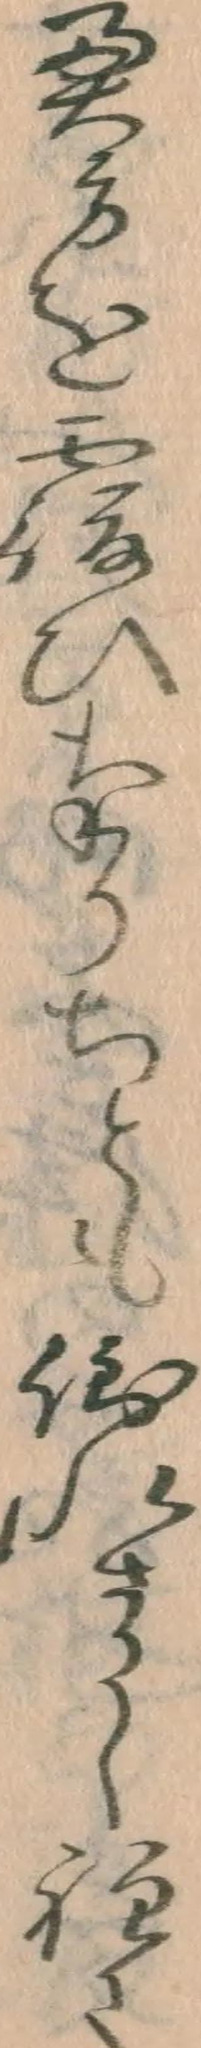奥方を覆ひ奉りちとも倒れさりし程に
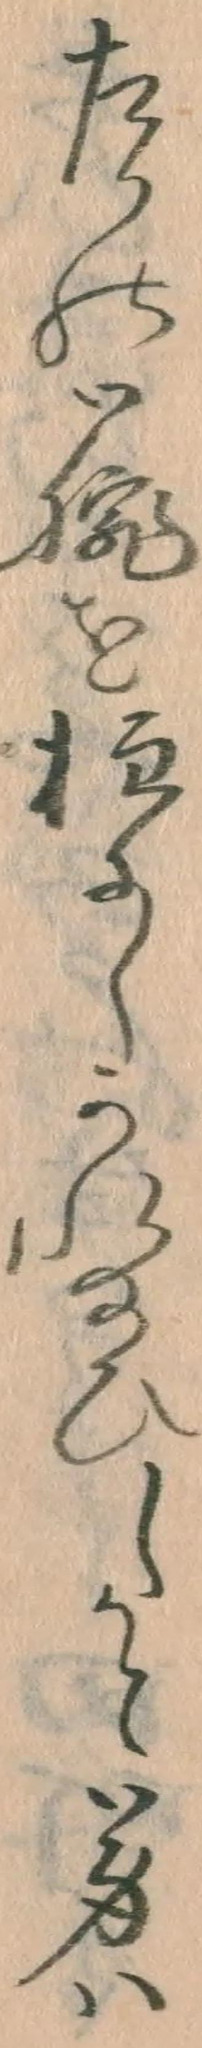左の御腕を柱にしかれ玉ひしかと御身ハ
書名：麗斎叢書. 20
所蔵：国立国会図書館 National Diet Library, JAPAN
